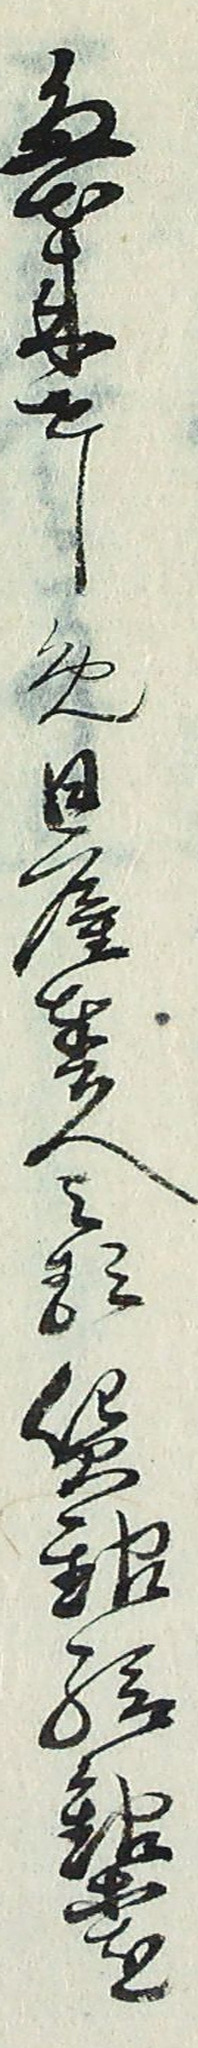多出来せしめ日雇奉公人之類賃銀給銀等を
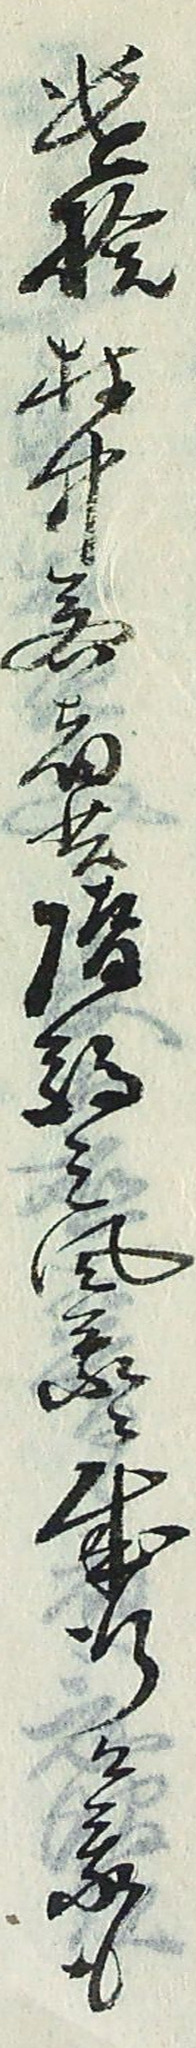遣捨村中若者共惰弱之風義ニ成行候義も
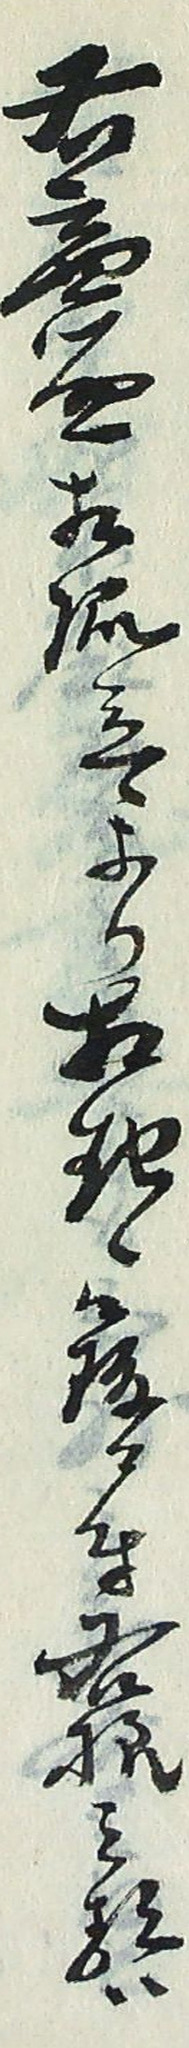右商筋相派立候より相起候御趣ニ付右様之類ハ
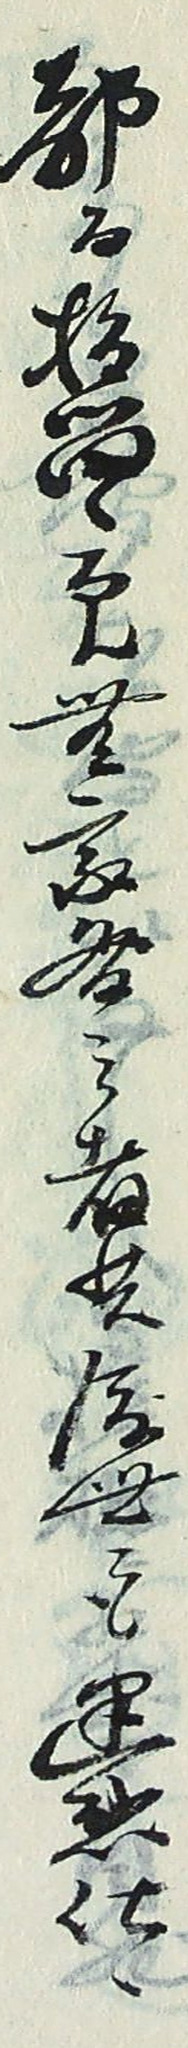都而指留候而ハ無家督之者共渡世ニも迷惑仕候
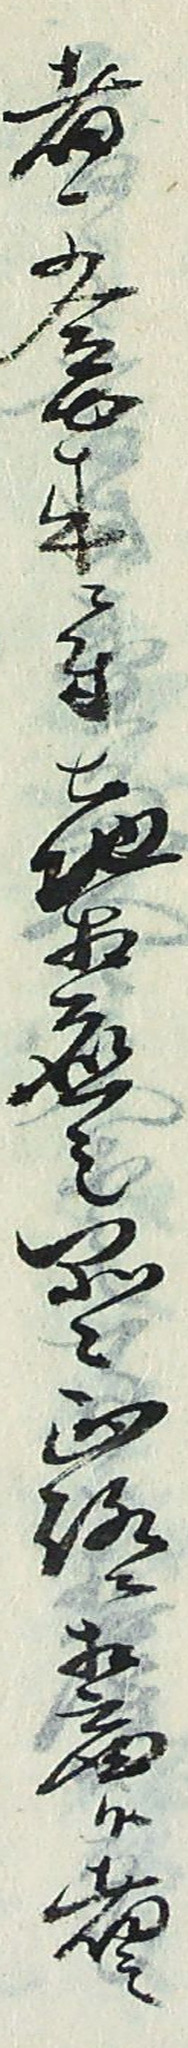者可令出来ニ付土地相應之品々正路ニ相商候者之
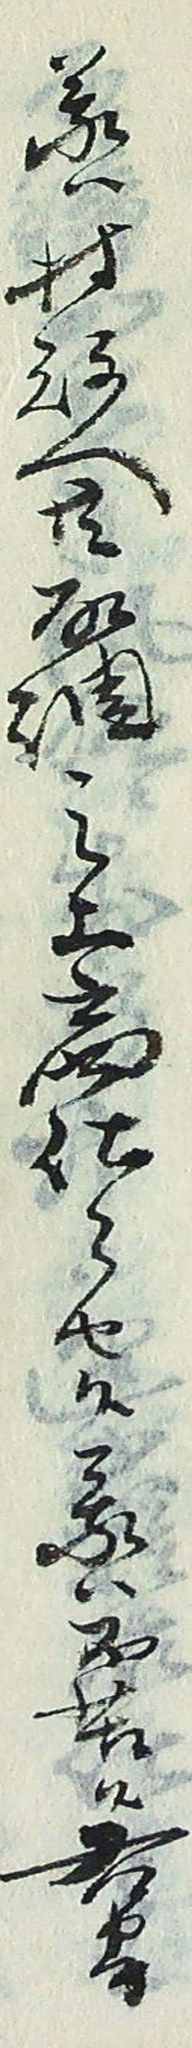義ハ村役人共取調之上商仕らせ候義ハ不苦候右申付
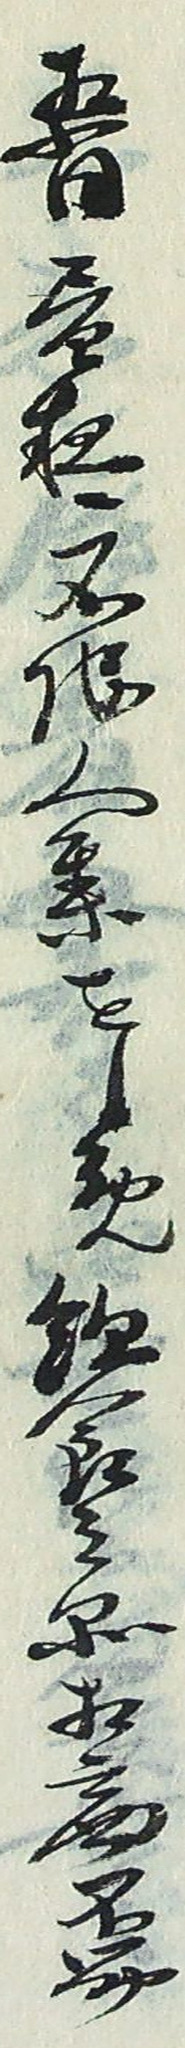相背晝夜ニ不限人集せしめ飲食之品相商不筋
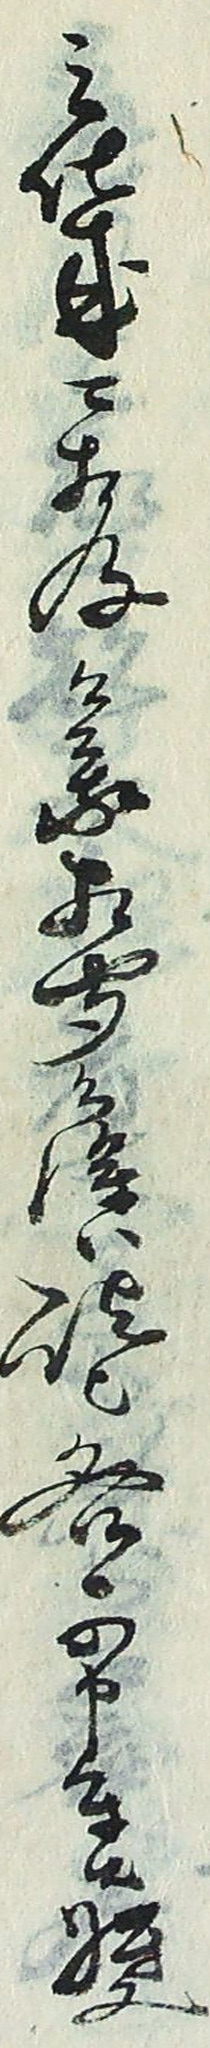之仕成ニ相及候義相聞候得ハ屹と咎可申付候将又
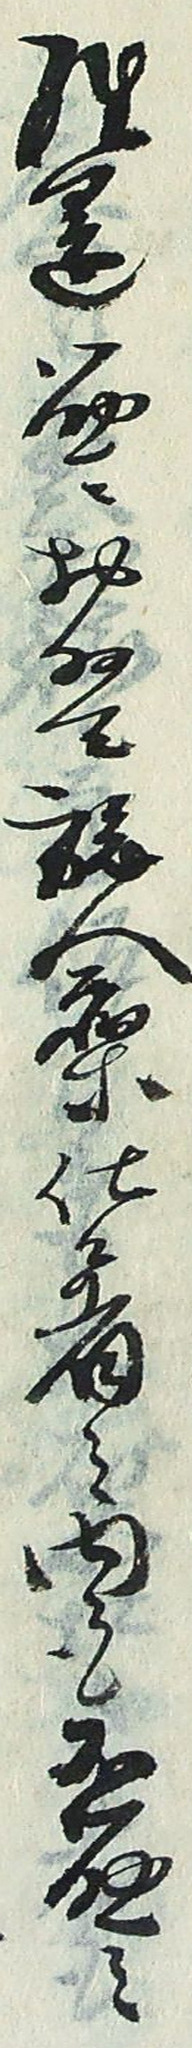往還筋ニおゐて旅人宿等仕候者之内ニも不筋之
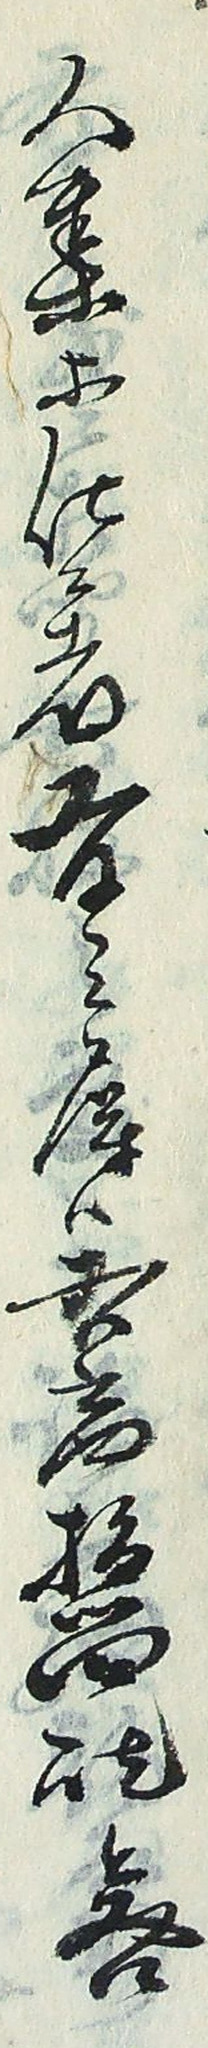人集等仕候者有之候得ハ右商指留屹と咎
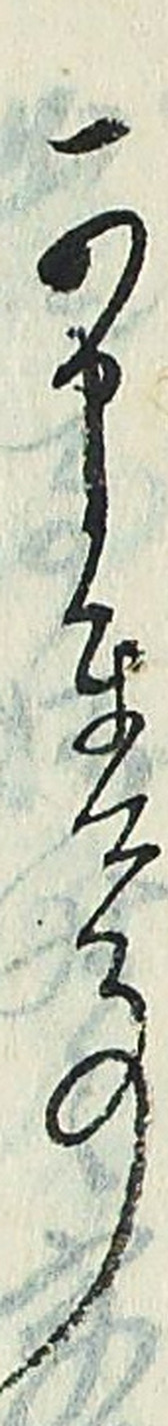可申付候事
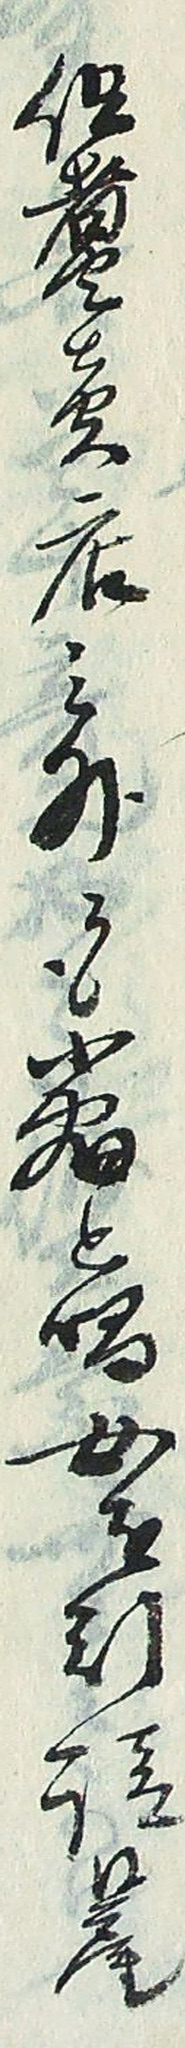但煑賣店之外ニも小宿と唱女を引請日雇

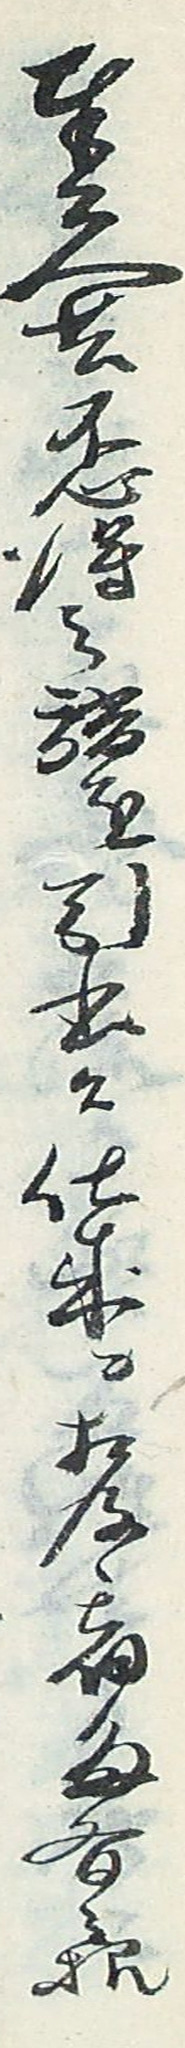奉公人共不心得之端を引出候仕成ニ相及候者多有之様
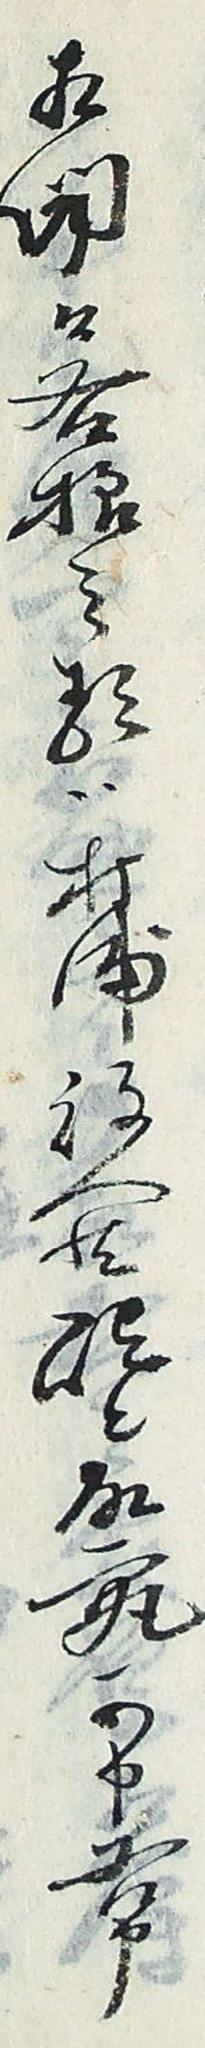相聞候右様之類ハ村浦役人共屹と取究可申右申
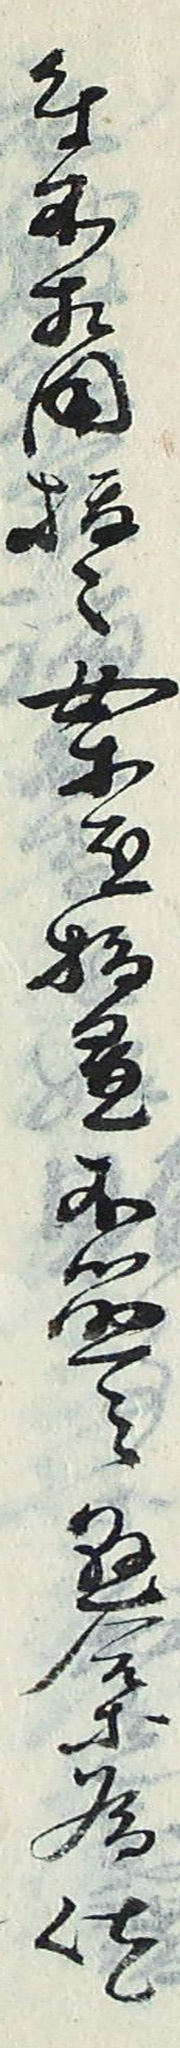付不相用抜々女等を指置不筋之懸合等為仕候
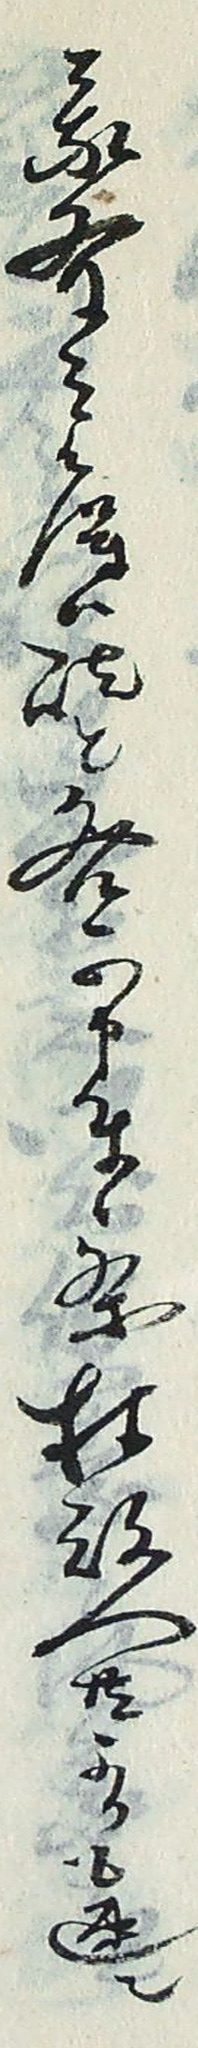義有之候得ハ屹と咎可申付候条村役人共よりも速ニ
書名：諸御趣意書并御下知向之写
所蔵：鳴門教育大学 Naruto University of Education
